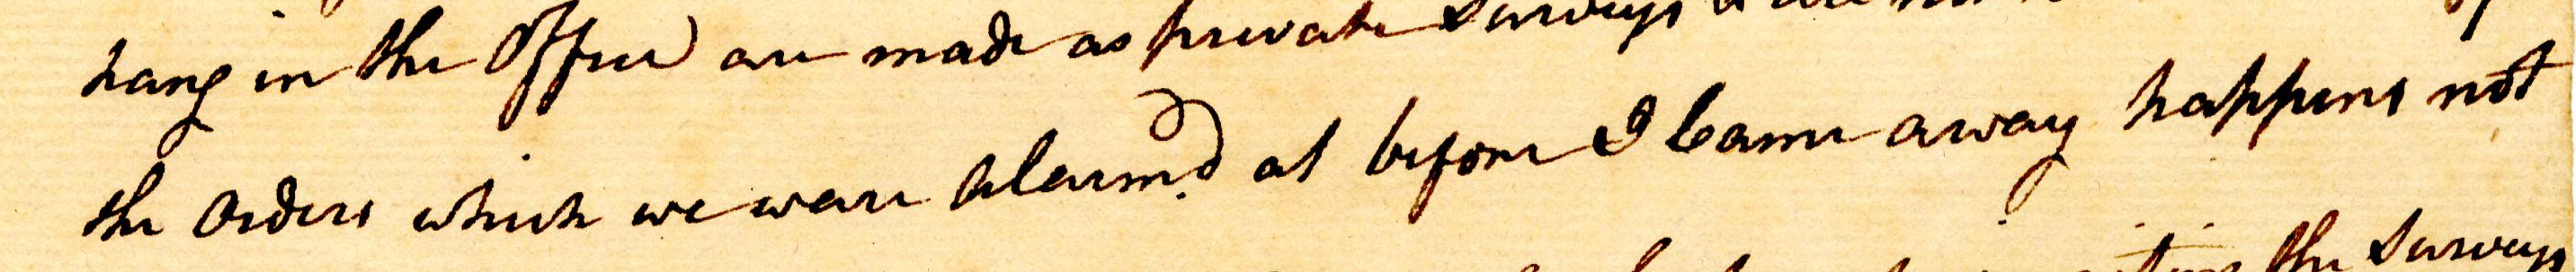the Orders which we were Alarm'd at before I Cam away happens not
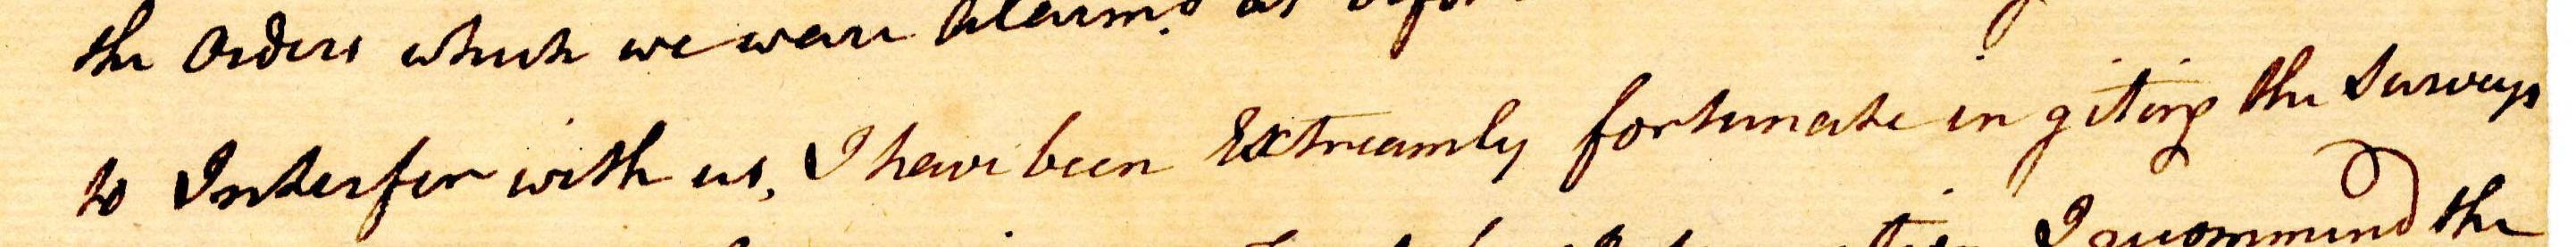to Interfer with us, I have been Extreamly forgunate in giting the Surveys
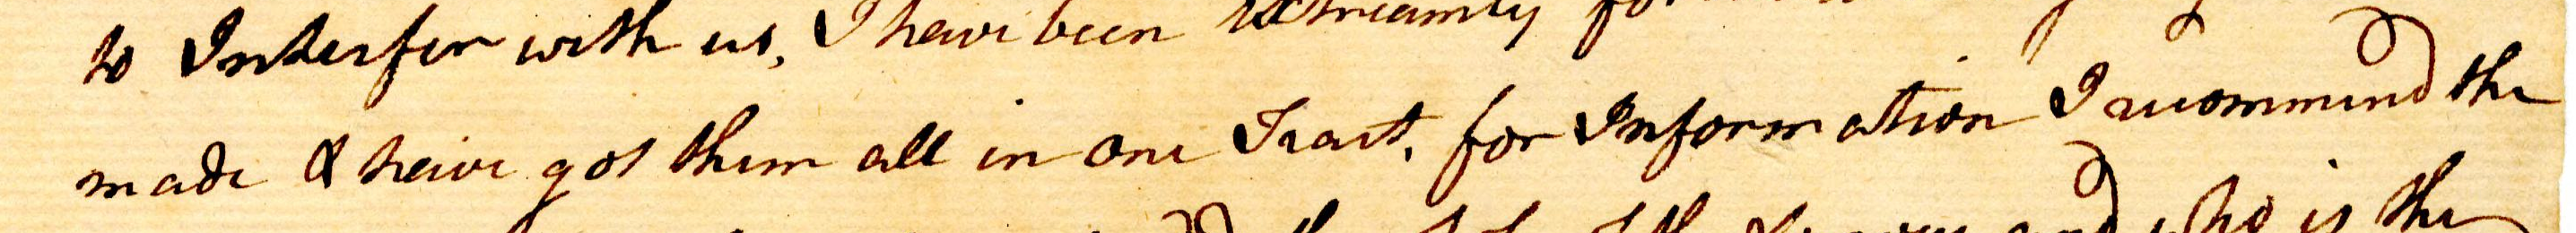made & have got them all in on tract, for Information I recommend the
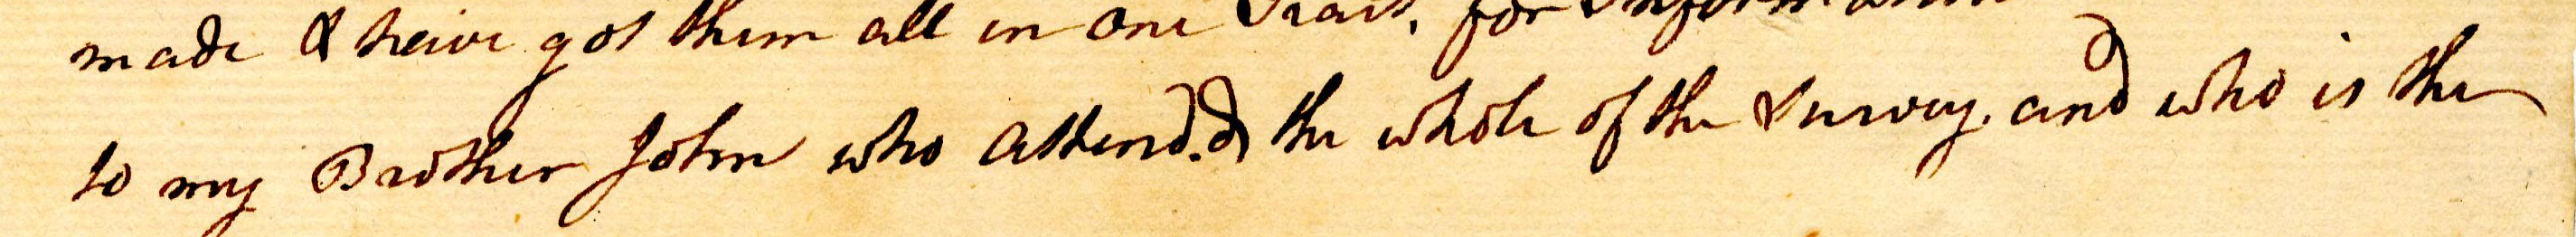to my Brother Johhn who attend'd the whole of the survey and who is the
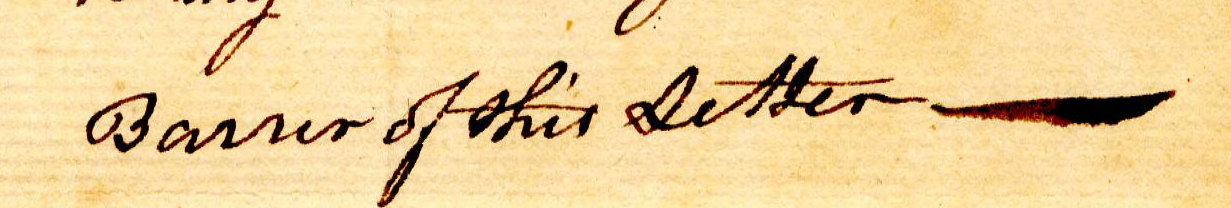Barrer of this Letter-
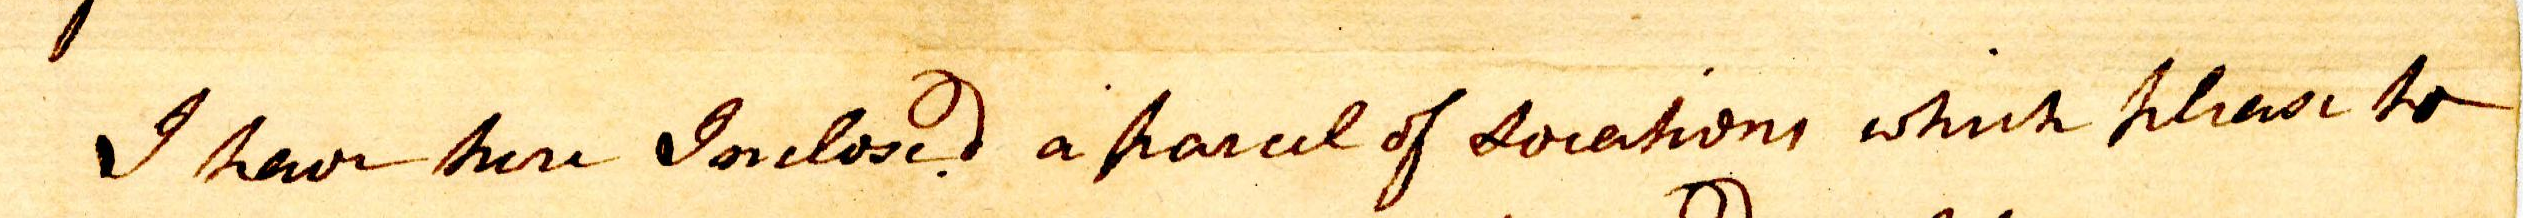I have here Inclosed a parcel of Locations which please to
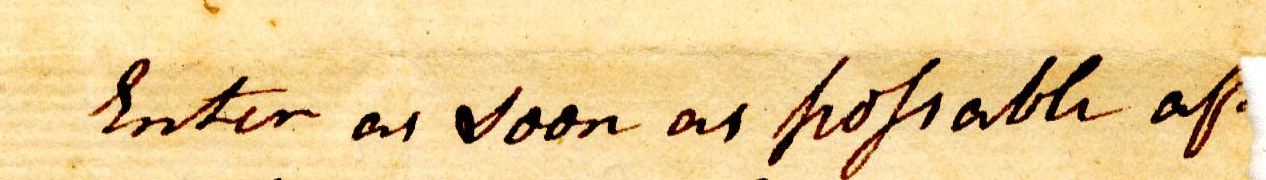Enter as soon as possable as
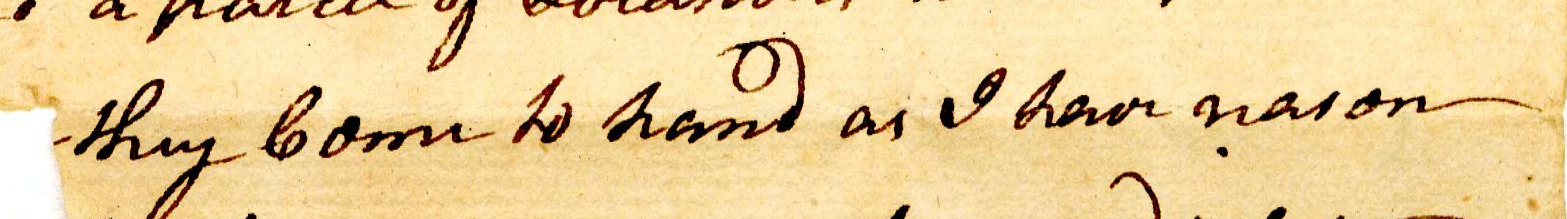they Come to hand as I have reason
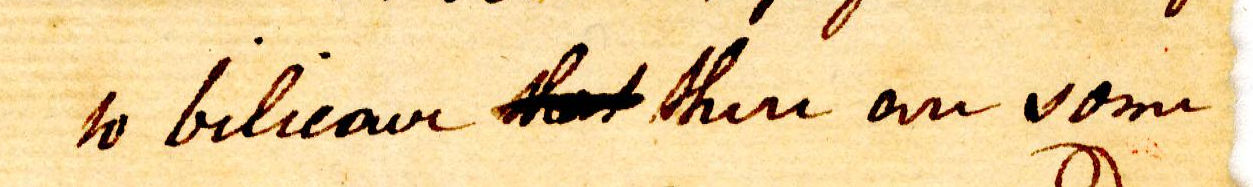to belieave [that] there are some
